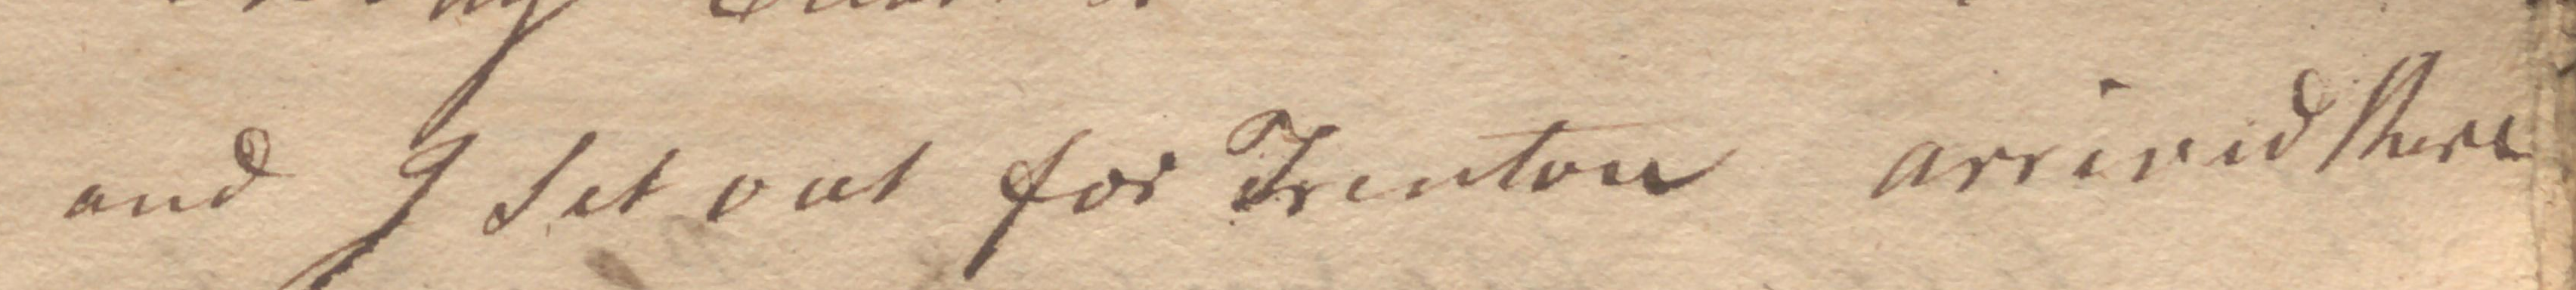and I set out for Trenton arrived there
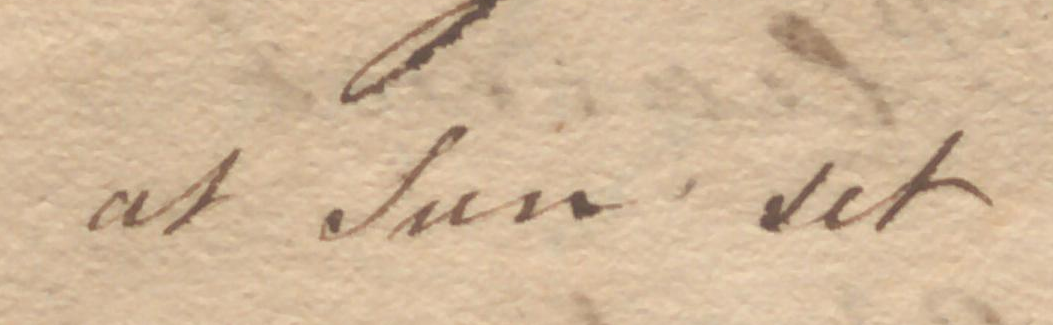at sun set
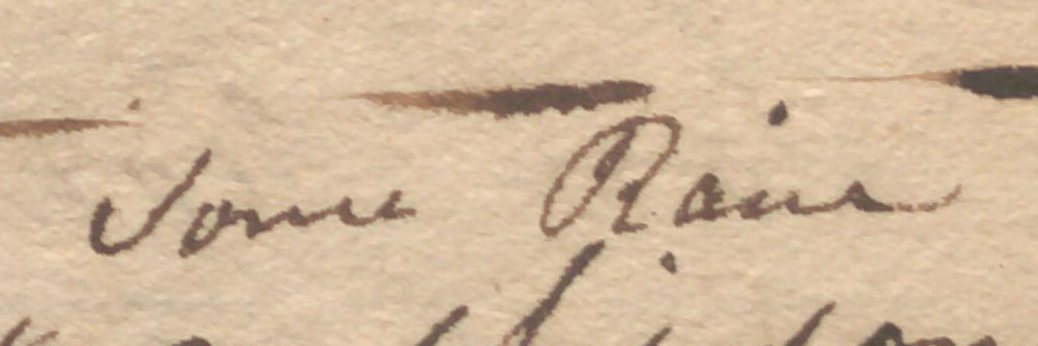some Rain
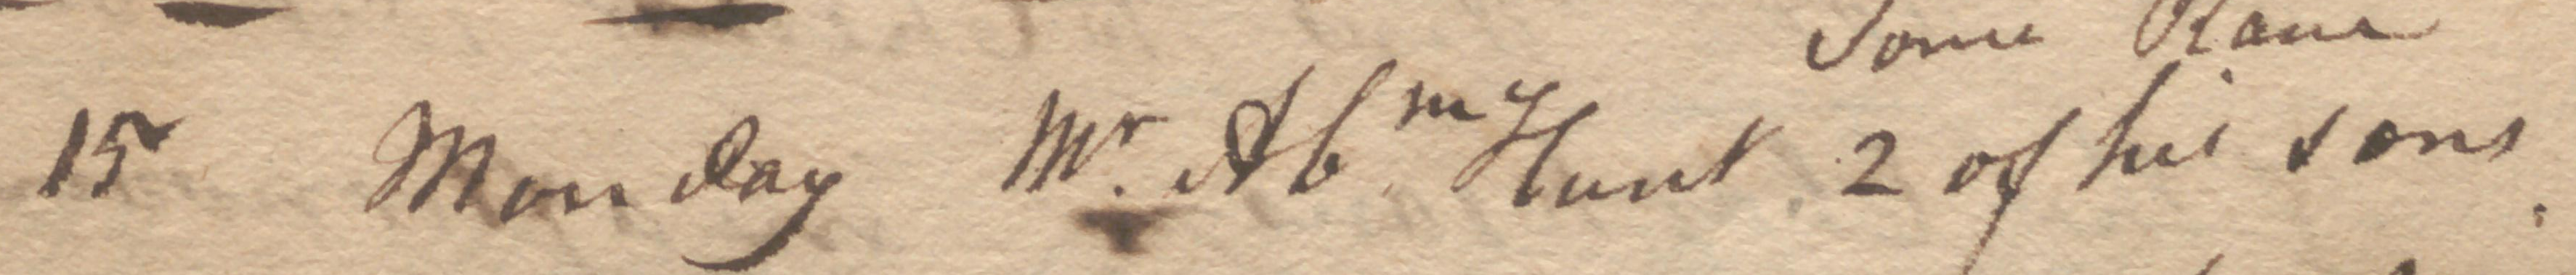15 Monday M^r. Ab^m. Hunt 2 of his sons
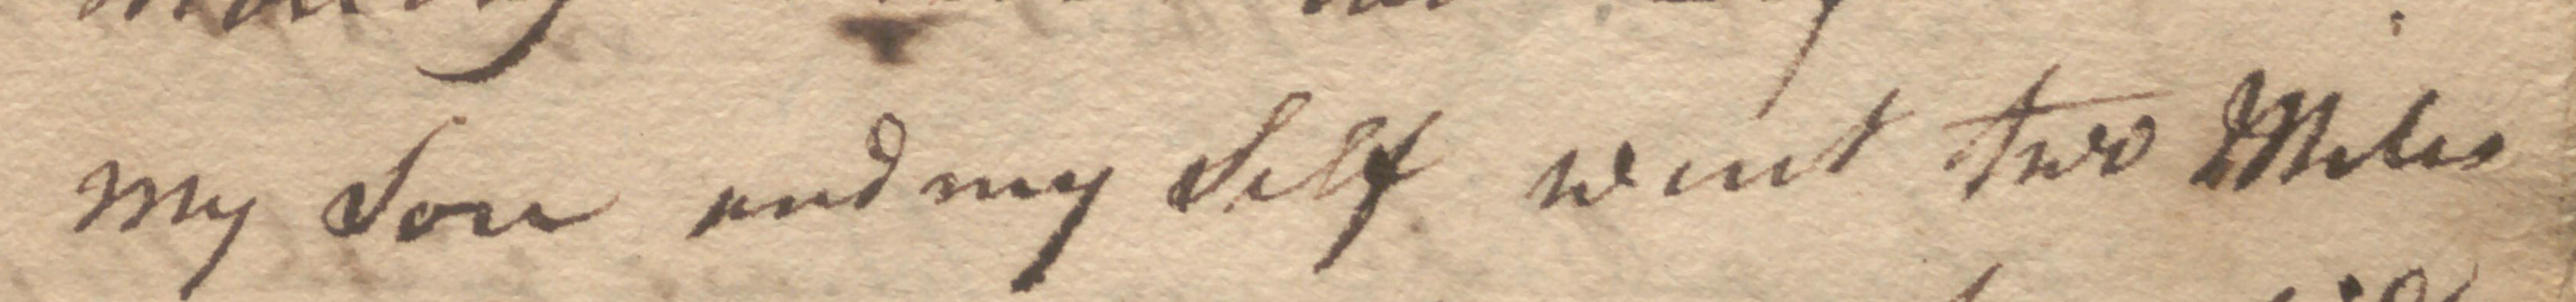My Son and my self went two Miles
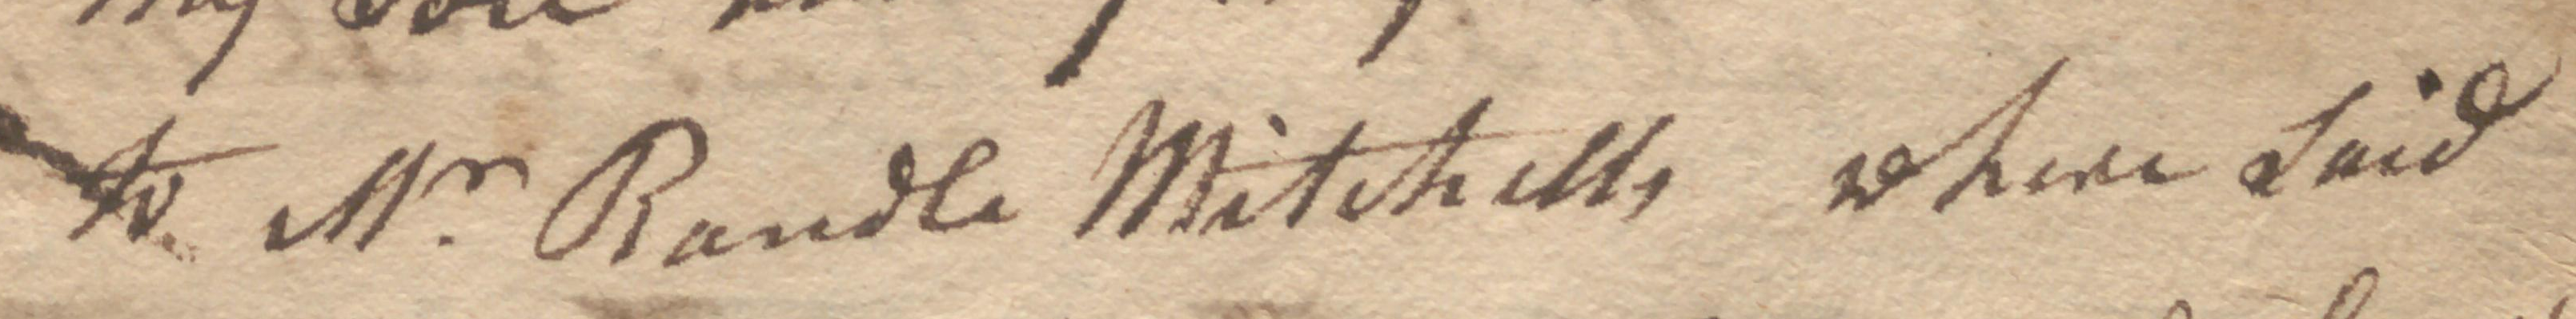to M^r. Randle Mitchells where said
